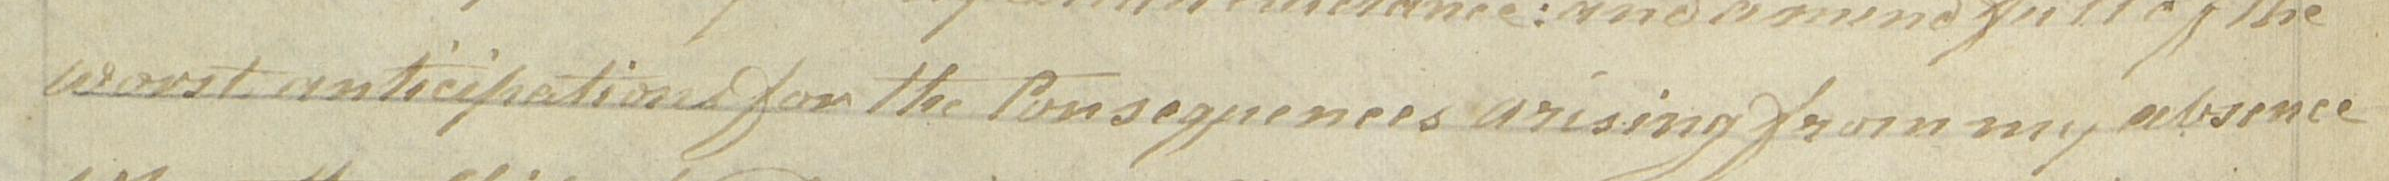worst anticipation for the Consequences arising from my absence
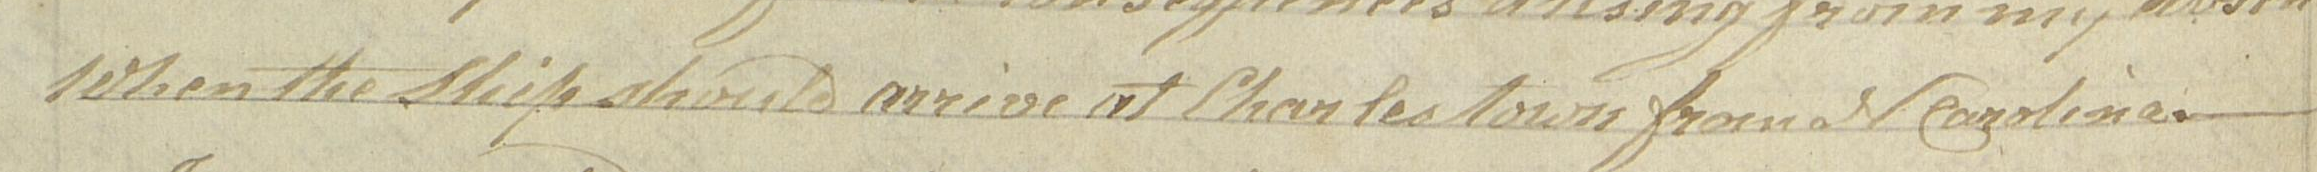When the Ship should arrive at Charles town from N Carolina,
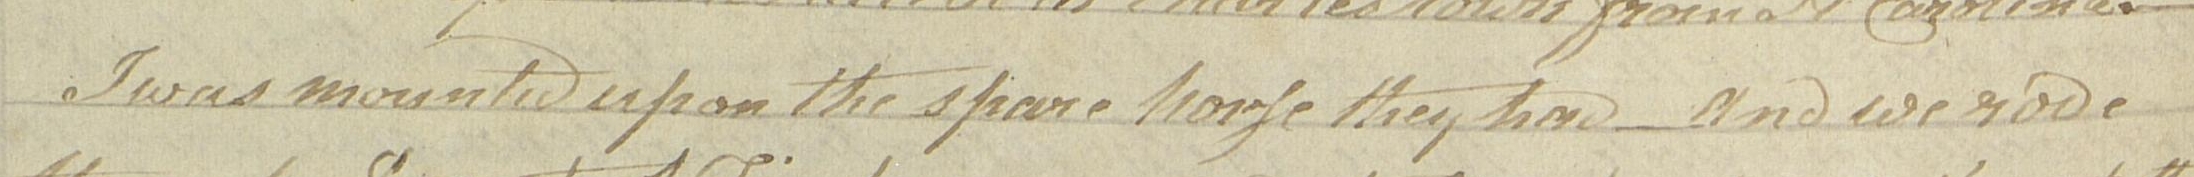I was mounted upon the spare horse they had And we rode
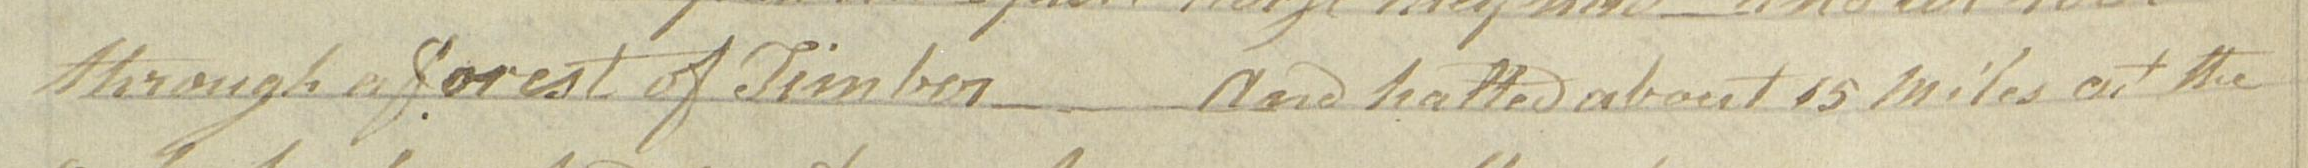through a forest of Timber And halted about 15 Miles at the
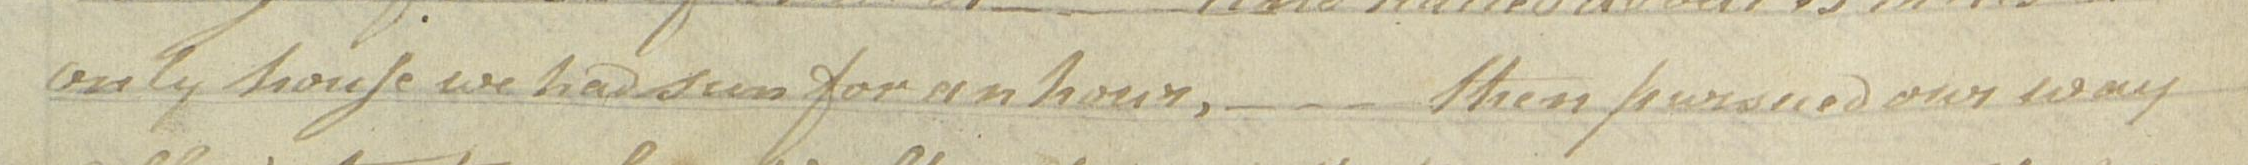only house we had seen for an hour, Then pursued our way
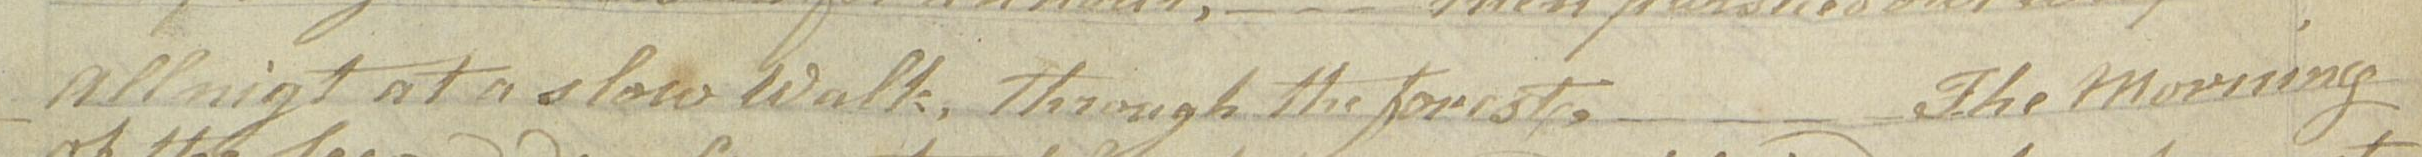all nigt at a slow Walk, through the forest, The Morning
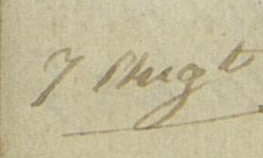7 Aug^t.
